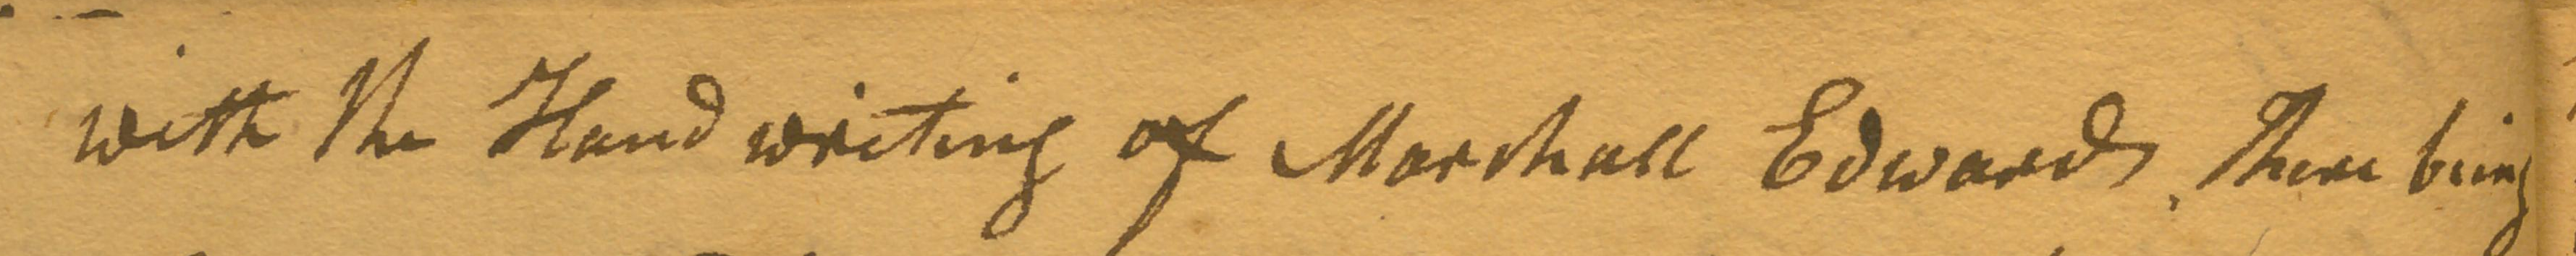with the Hand writing of Marshall Edwards There being
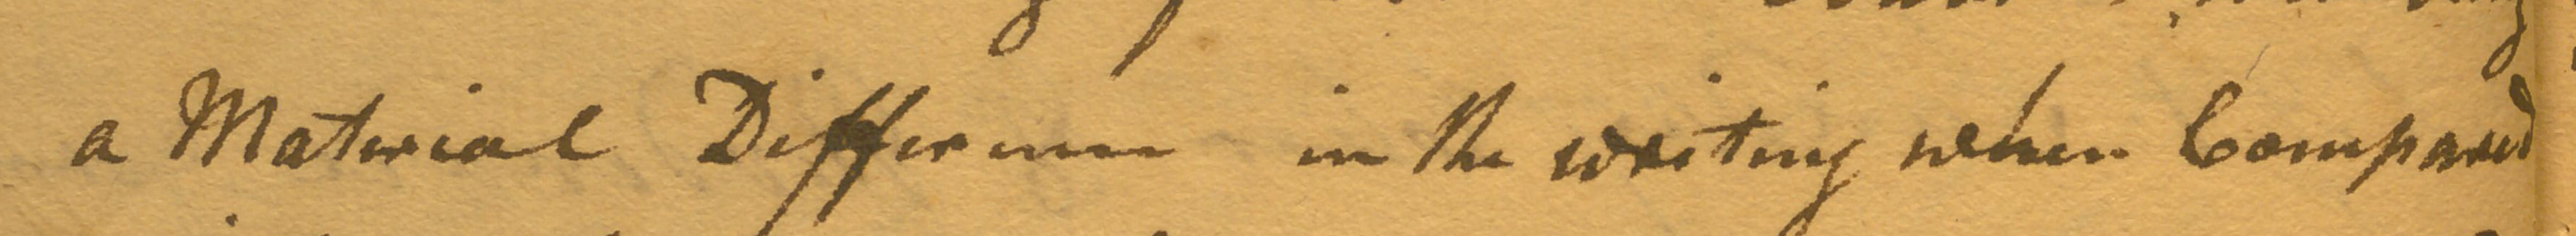a Material Difference in the writing when Compared
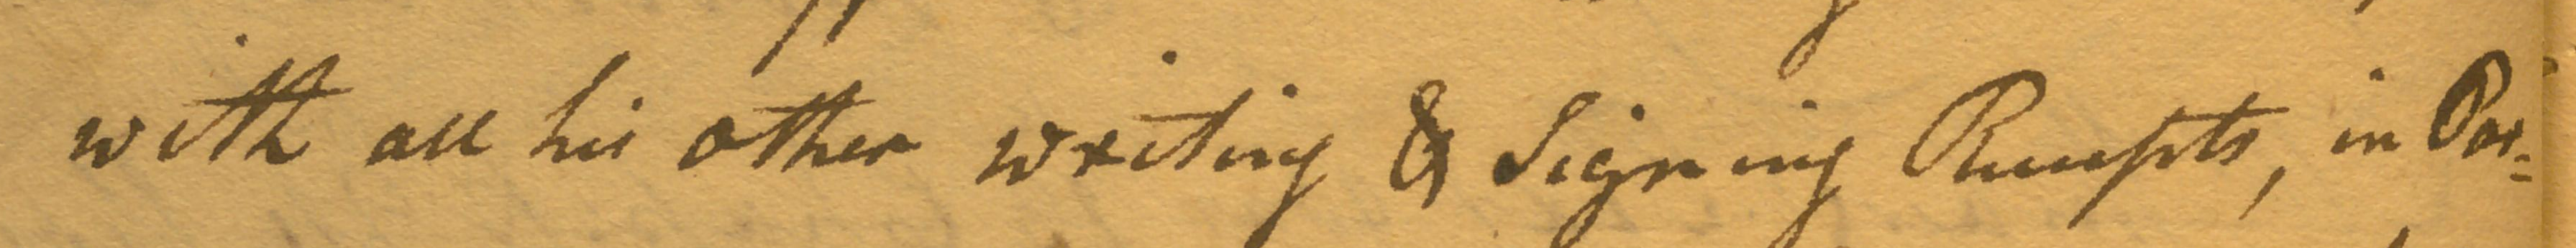with all his other writing & Signing Receipts, in Par-
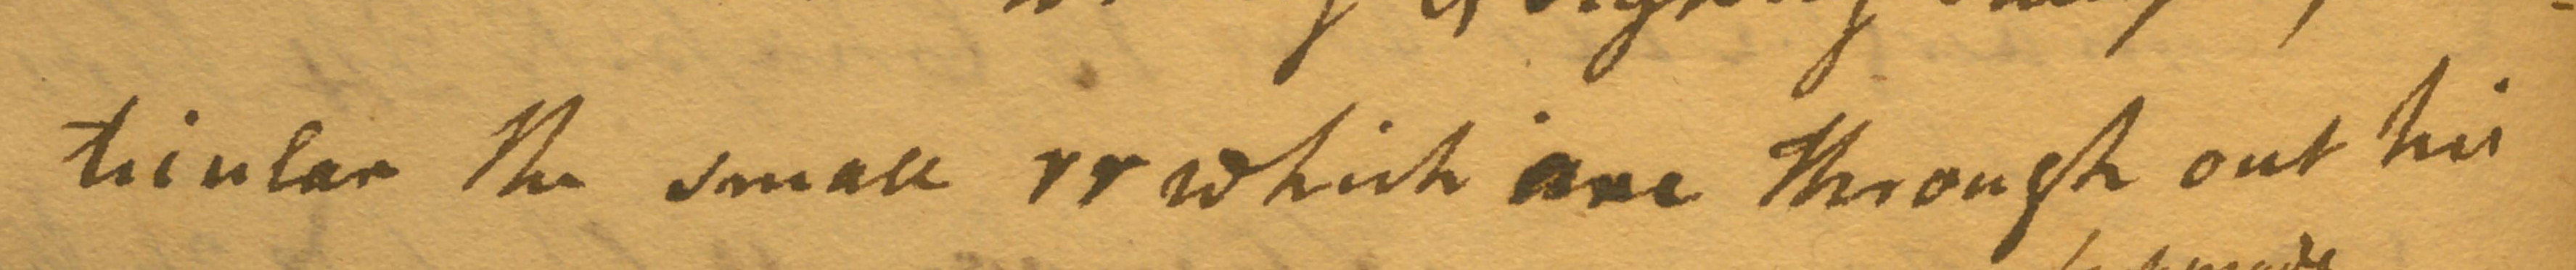ticular the small ,, which are through out his
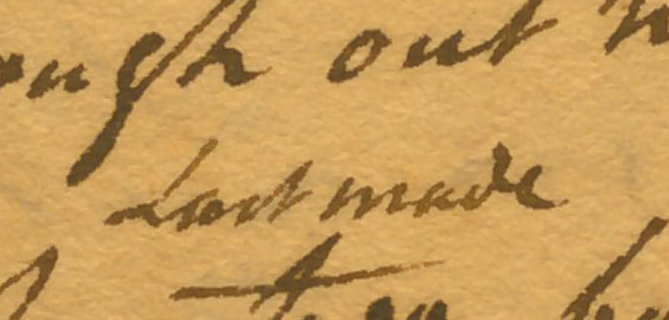Last made
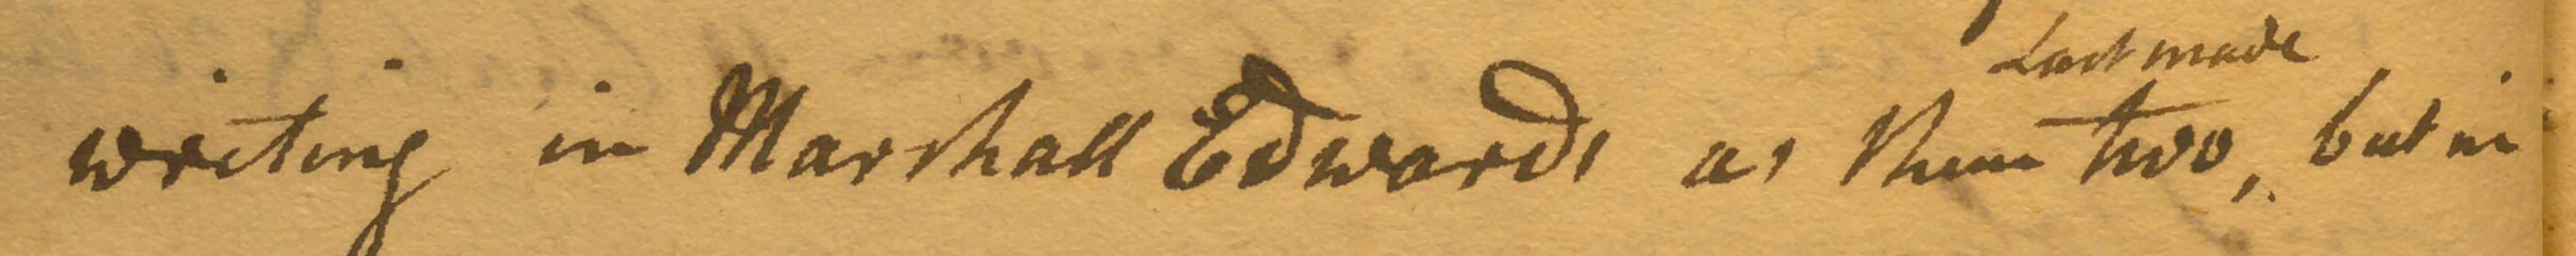writing in Marshall Edwards as them two, but in
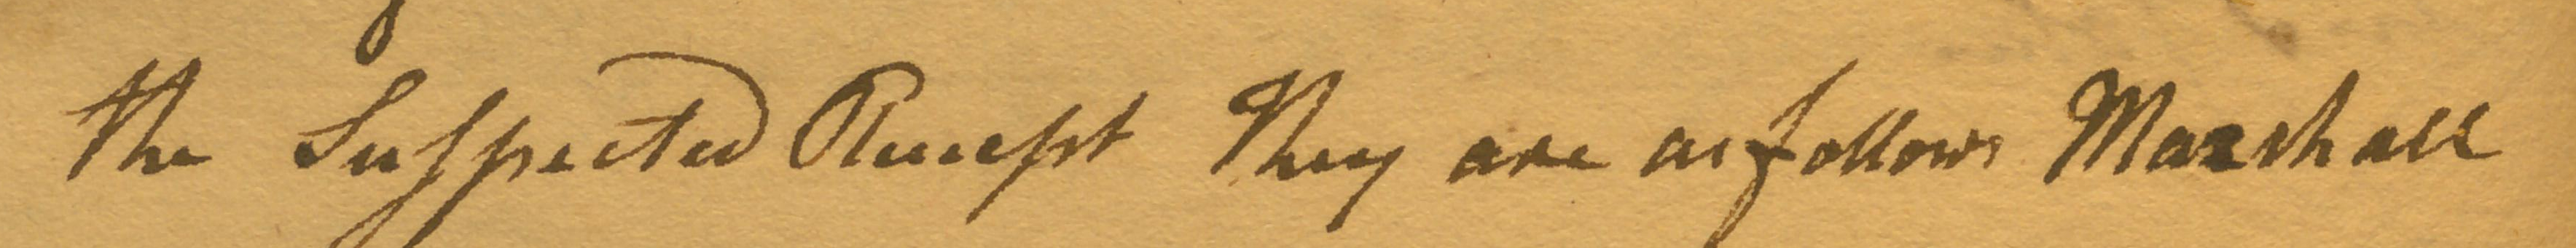the Suspected Receept They are as follows Marshall
